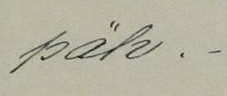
päh.
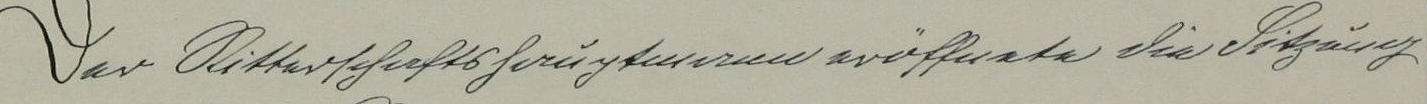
Der Ritterschaftshauptmann eröffnete die Sitzung
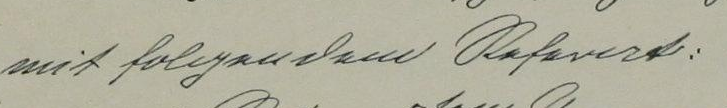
mit folgendem Referat:
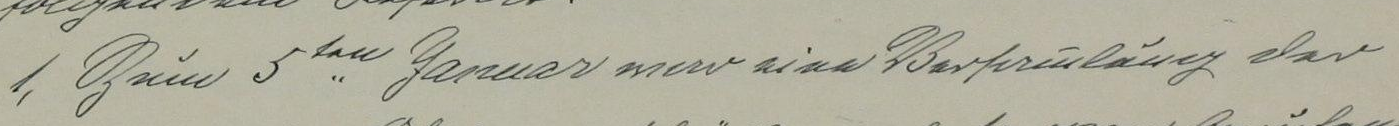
1. Zum 5ten Januar war eine Versammlung der
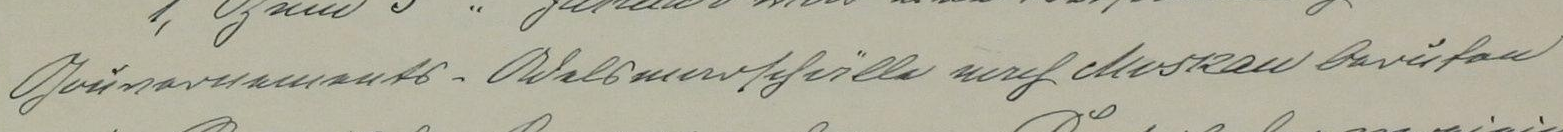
Gouvernements-Adelsmarschälle nach Moskau berufen
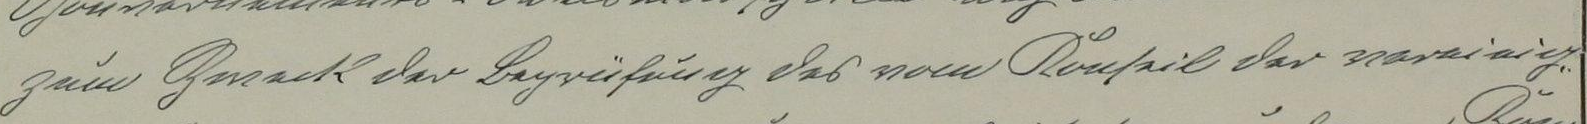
zum Zweck der Beprüfung des vom Konseil der vereinig-
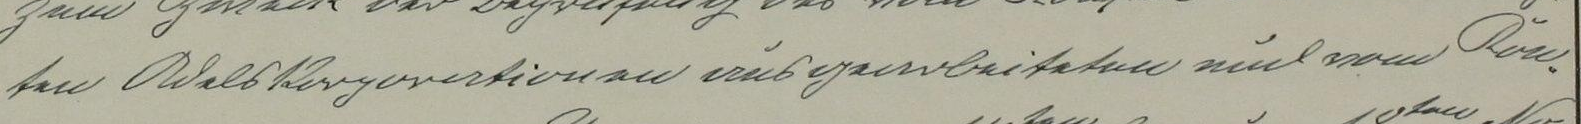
ten Adelskorporationen ausgearbeiteten und vom Kon-
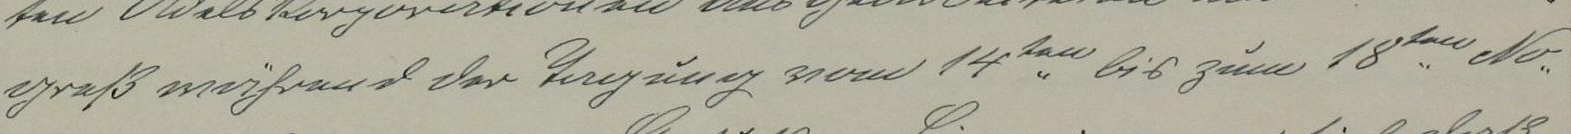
greß während der Tagung vom 14ten bis zum 18ten No-
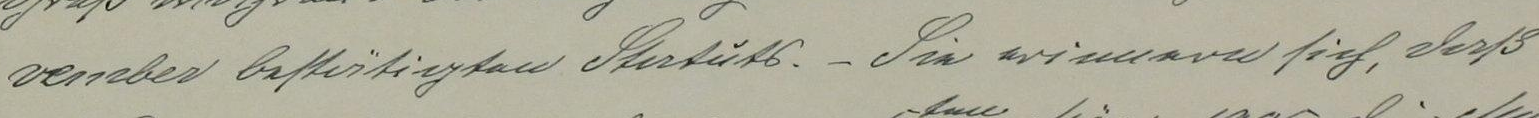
vember bestätigten Statuts. – Sie erinnern sich, daß
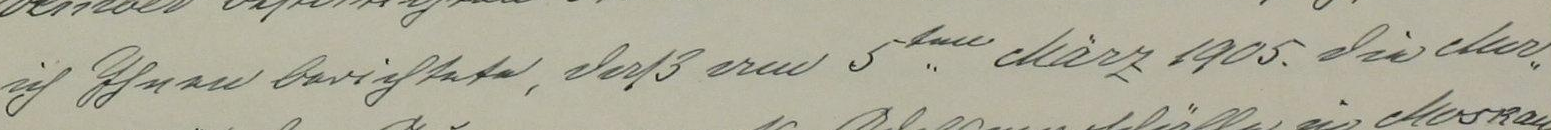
ich Ihnen berichtete, daß am 5ten März 1905. die Ma-
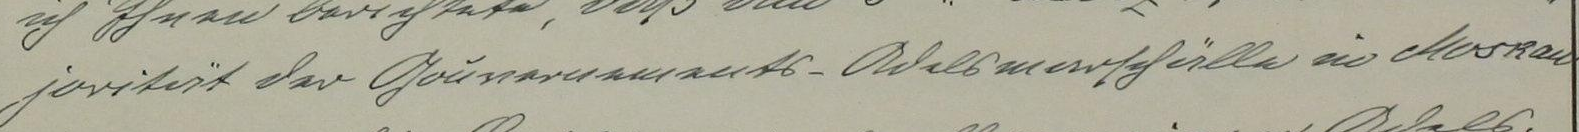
jorität der Gouvernements-Adelsmarschälle in Moskau
